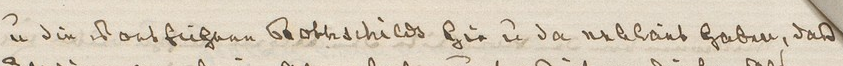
u die Wortführer Rothschilds hie u da erklärt haben, daß
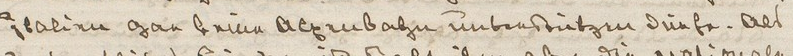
Italien gar keine Alpenbahn unterstützen dürfe. Als
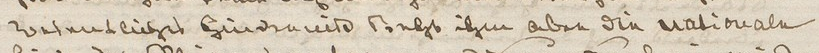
wesentliches Hinderniß steht ihm aber die nationale
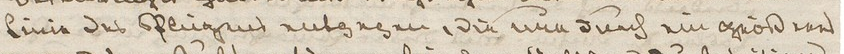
Linie des Splügens entgegen, die nur durch ein größeres
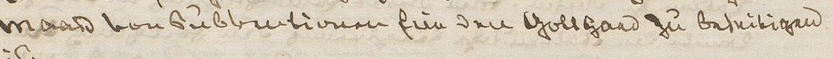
Maaß von Subventionen für den Gotthard zu beseitigen
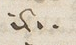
ist.
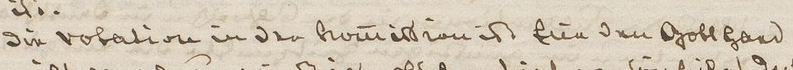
Die Votation in der Kommission ist für den Gotthard
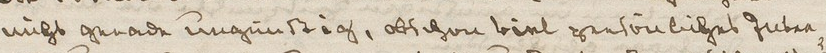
nicht gerade ungünstig, obschon viel persönliches Inter-
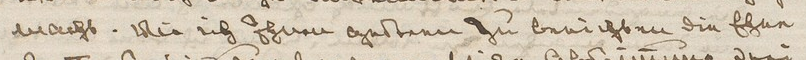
macht. Wie ich Ihnen gestern zu berichten die Ehre
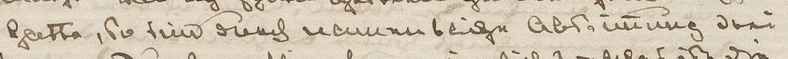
hatte, so sind durch namentliche Abstimmung drei
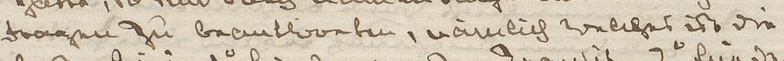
Fragen zu beantworten, nämlich welches ist die
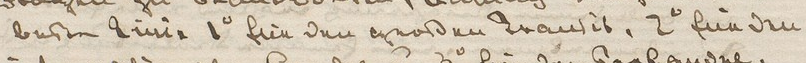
beste Linie 1o für den großen Transit, 2o für den
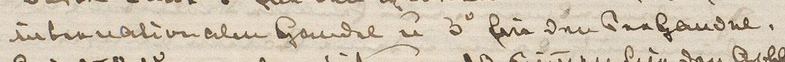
internationalen Handel u 3o für den Seehandel.
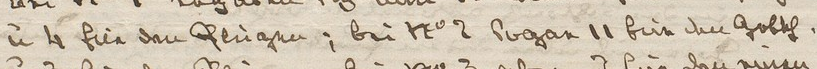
u 4 für den Splügen; bei No 2 sogar 11 für den Gotth.
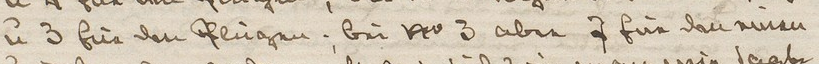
u 3 für den Splügen; bei No 3 aber 7 für den einen
